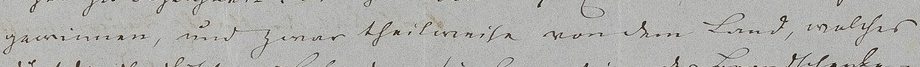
gewinnen, und zwar theilweise von dem Land, welches
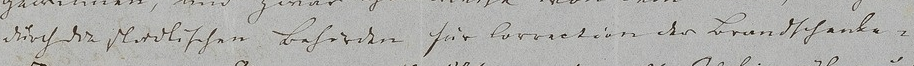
durch die städtischen Behörden für Correction der Brandschenke-
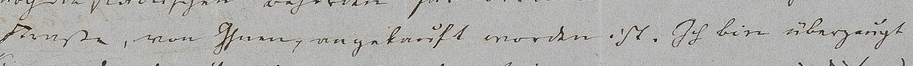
straße, von Ihnen, angekauft worden ist. Ich bin überzeugt
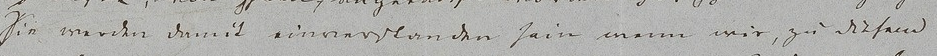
Sie werden damit einverstanden sein wenn wir, zu diesem
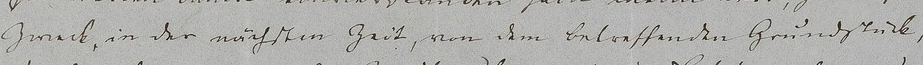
Zweck, in der nächsten Zeit, von dem betreffenden Grundstück,
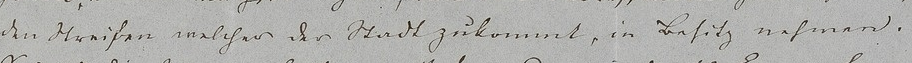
den Streifen welcher der Stadt zukommt, in Besitz nehmen.
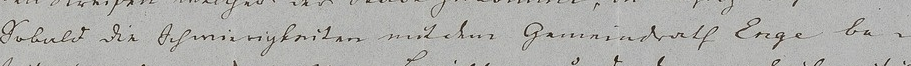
Sobald die Schwierigkeiten mit dem Gemeindrath Enge be-
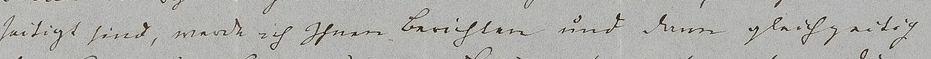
seitigt sind, werde ich Ihnen berichten und dann gleichzeitig
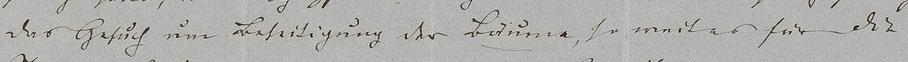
das Gesuch um Beseitigung der Bäume, so weit es für die
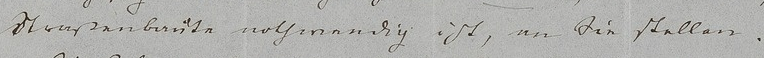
Straßenbaute nothwendig ist, an Sie stellen.
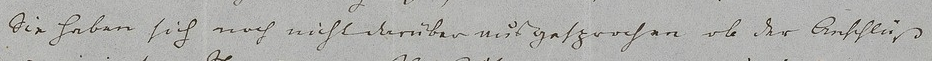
Sie haben sich noch nicht darüber ausgesprochen ob der Anschluß
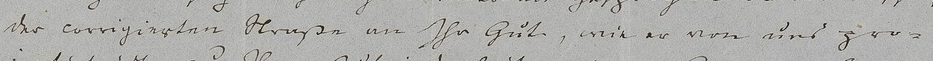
der corrigierten Straße an Ihr Gut, wie er von uns pro-
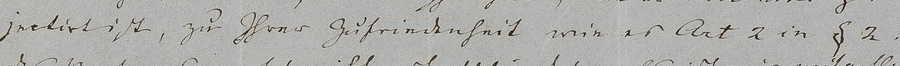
jectirt ist, zu Ihrer Zufriedenheit wie es Art 2 in § 2.
